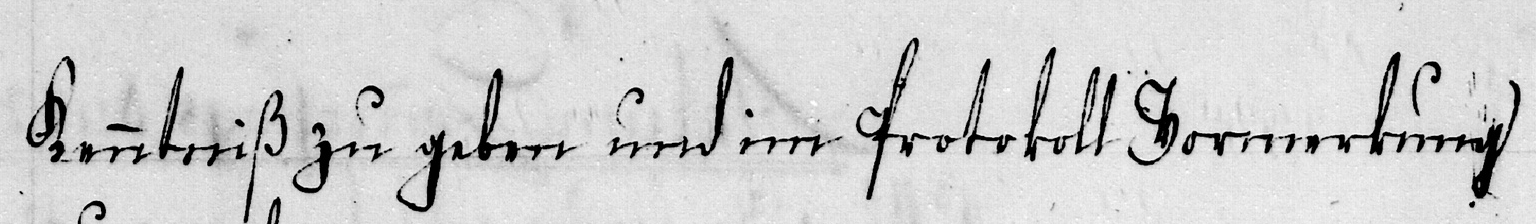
Kenntniß zu geben und im Protokoll Vormerkung
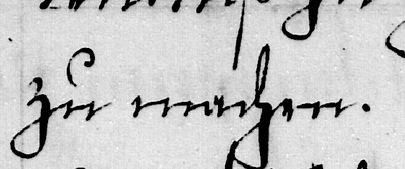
zu machen.
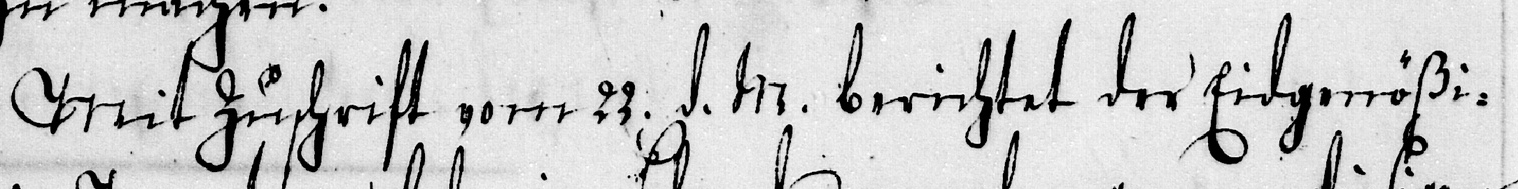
Mit Zuschrift vom 22. d. M. berichtet der Eidgenößi¬
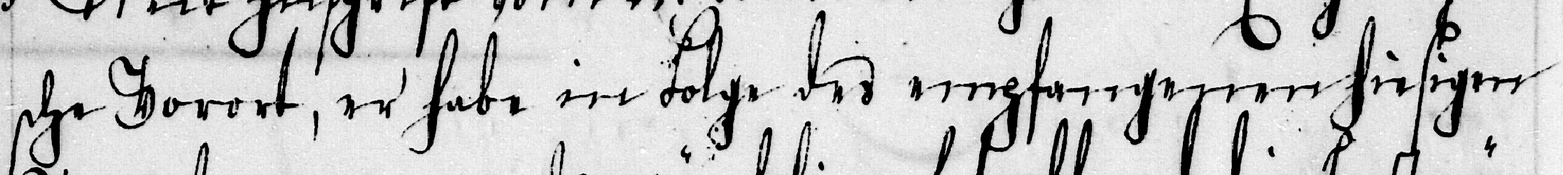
sche Vorort, er habe in Folge des empfangenen hiesigen
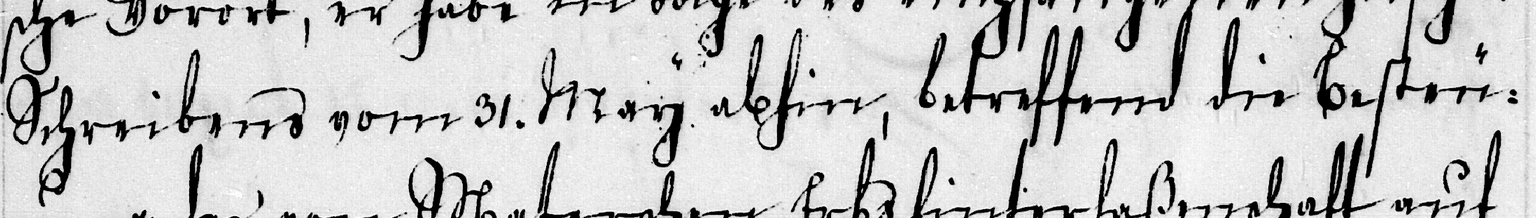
Schreibens vom 31. May abhin, betreffend die Besteu¬
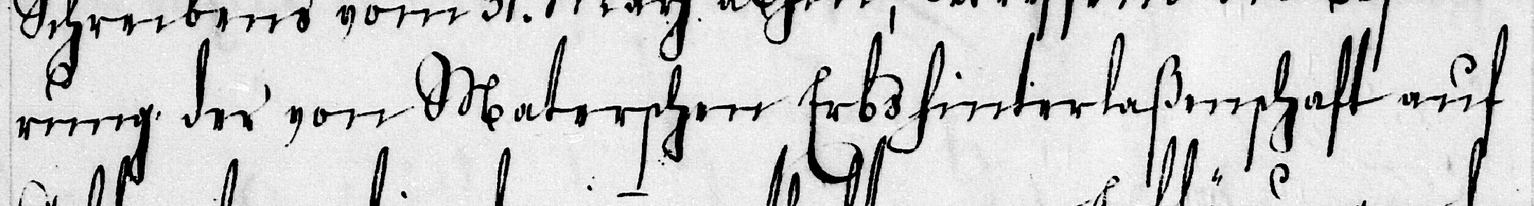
rung der von Materschen Erbshinterlaßenschaft auf
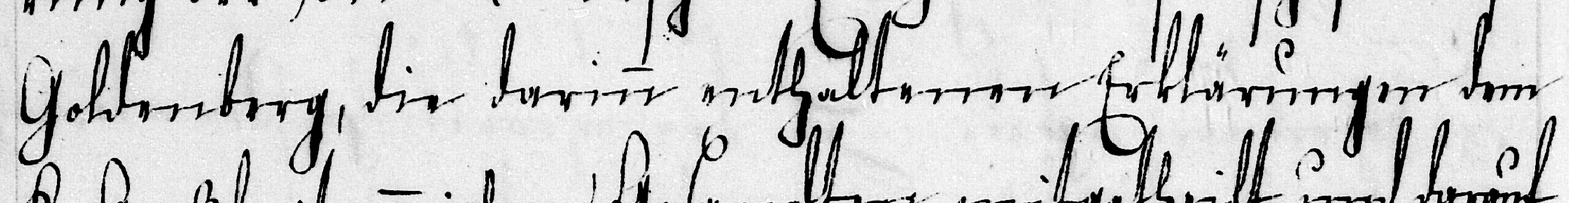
Goldenberg, die darinn enthaltenen Erklärungen dem
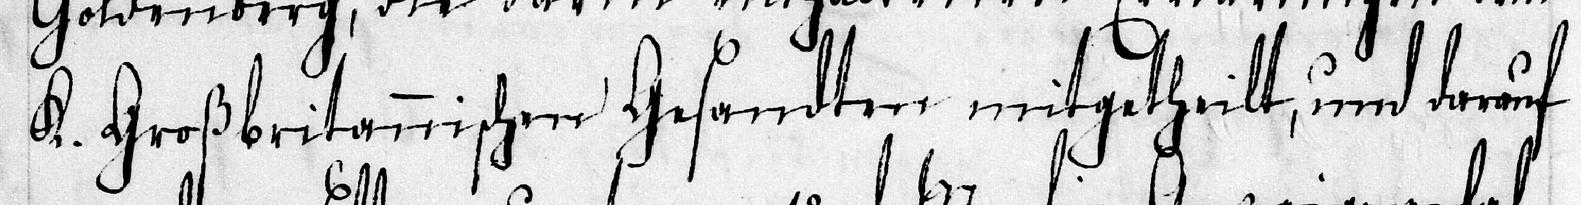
K. Großbritannischen Gesandten mitgetheilt, und darauf
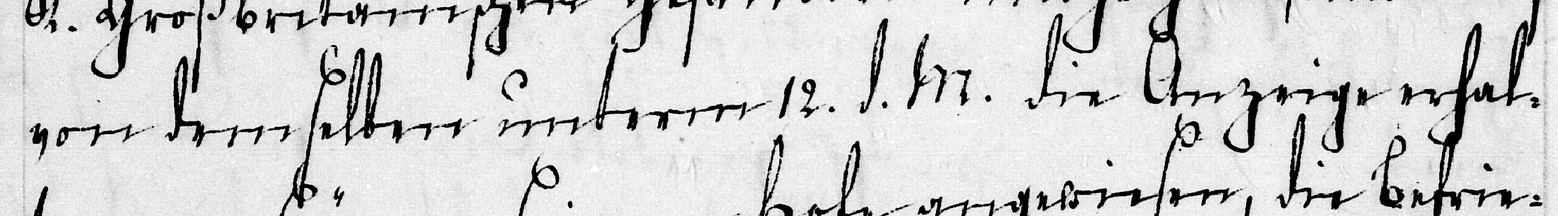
von demselben unterm 12. d. M. die Anzeige erhal¬
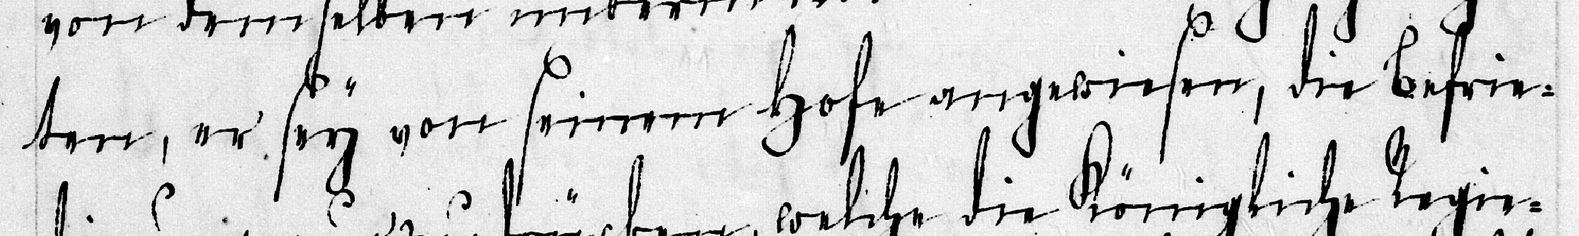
ten, er sey von seinem Hofe angewiesen, die Befrie¬
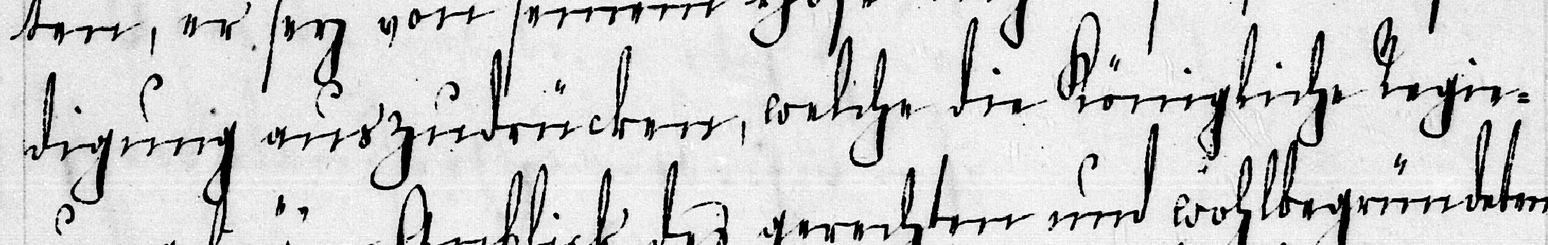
digung auszudrücken, welche die königliche Regie¬
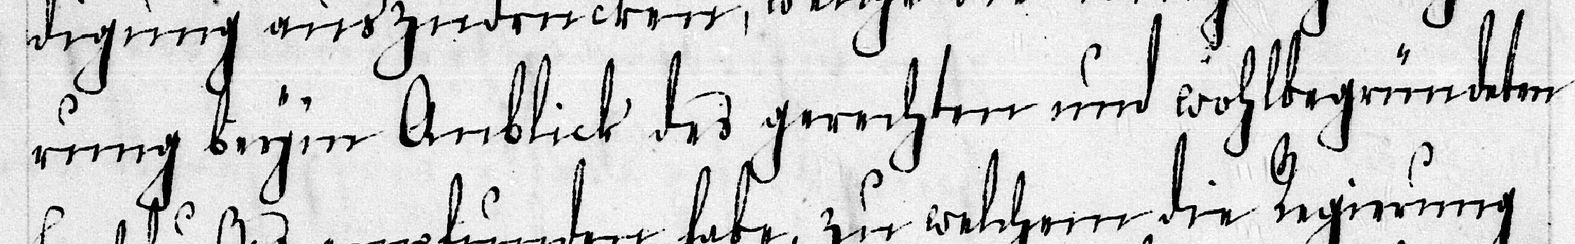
rung beym Anblick des gerechten und wohlbegründeten
